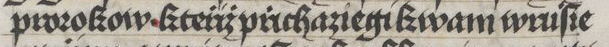prorokow.kteṙíż pṙichaziegí kwam wruẛie
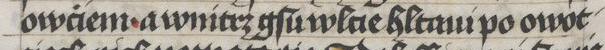owċiem.a wnitrz gſu wlcie hltaui po owot¬
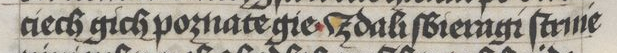cíech gich poznate gie.Zdali ſbieragí ſtrmie
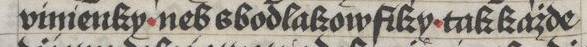vinienky.neb sbodlakow fiky.tak każde
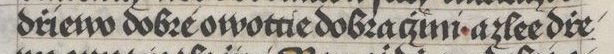dṙíewo dobré owotcie dobra cżiní.a zlee dṙe¬
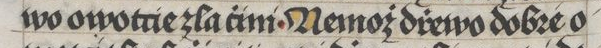wo owotcie zla ċiní.Nemoż dṙewo dobre o¬
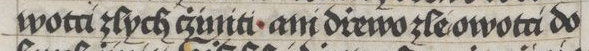wotci zlych cżiniti.ani dṙewo zle owotci do¬
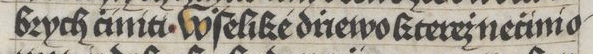brych cżiniti.Wẛeliké dṙiewo ktereż neċini o¬
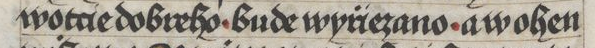wotcie dobreho.bude wyṙiezano.a w ohen
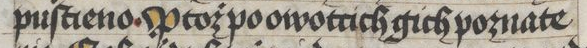puẛtieno.Ꝓtoż po owotcich gich poznate
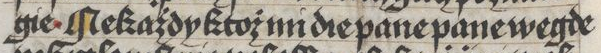gie.Nekażdy ktoż mi die pane pane wegde
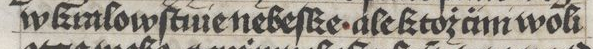w kralowſtuie nebeſke.ale ktoż ċini woli¬
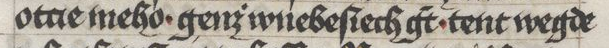otcie meho.genż wnebeſiech ḡt.tent wegde
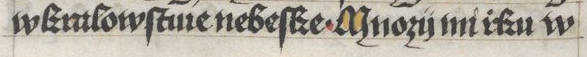wkralowſtuie nebeſke.Mnozij mi ṙku w¬
